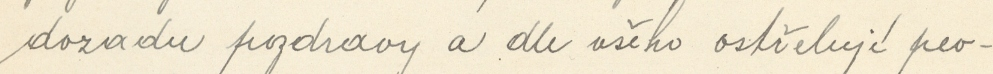dozadu pozdravy a dle všeho ostřelují pev-
